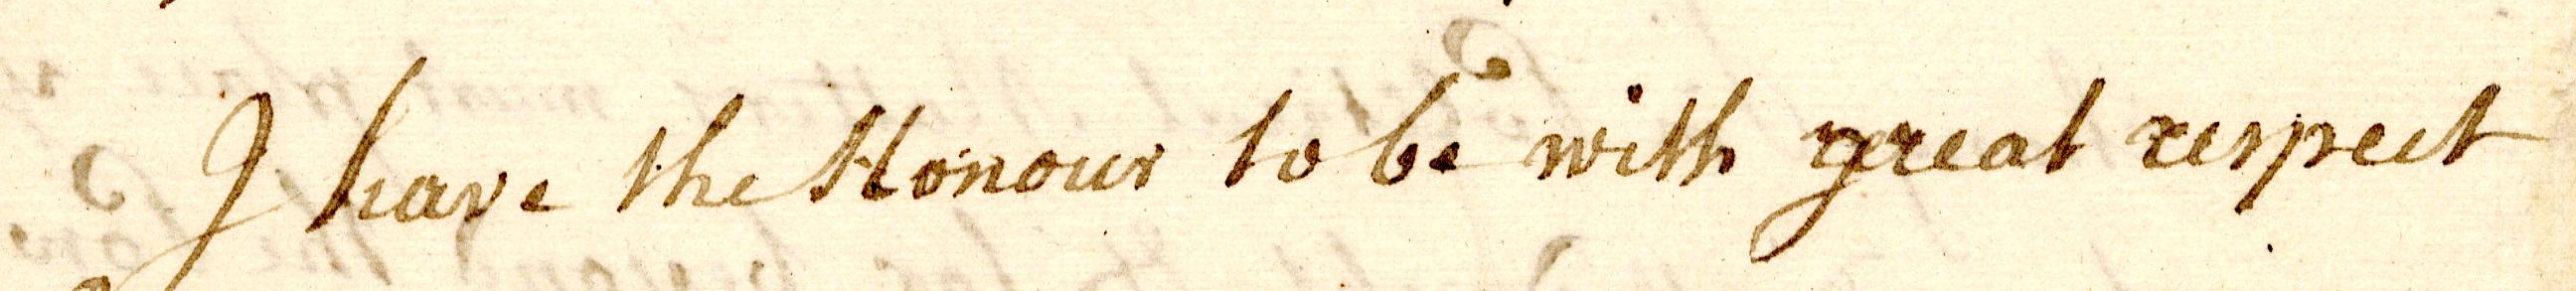I have the Honour to be with great respect
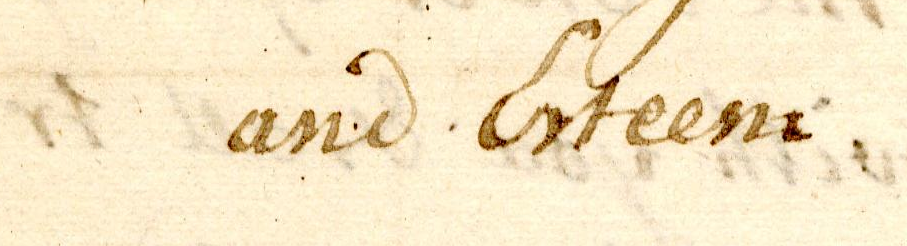and Esteem.
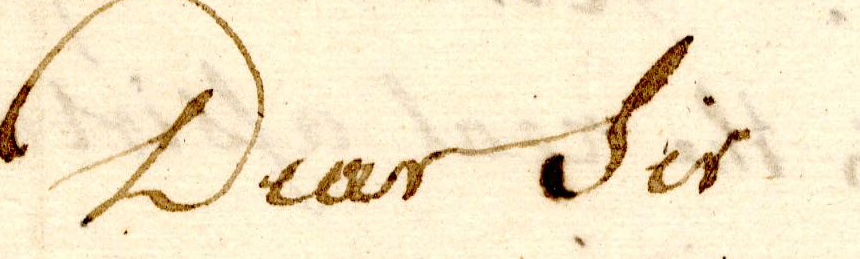Dear Sir
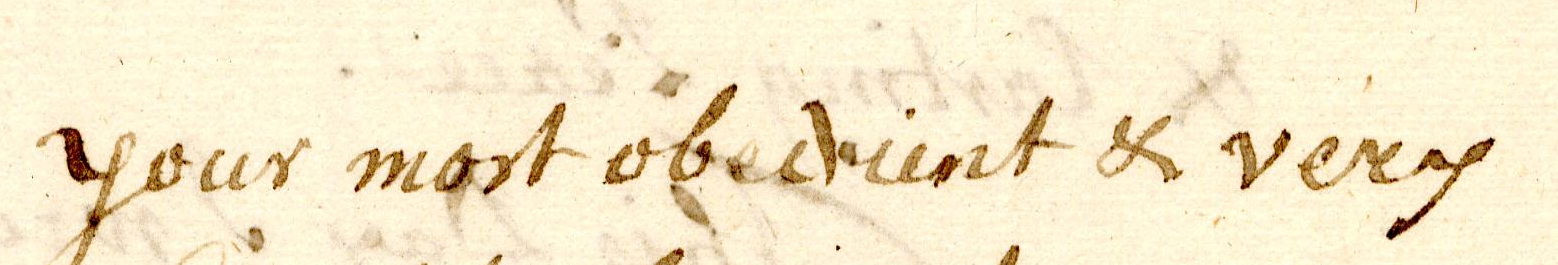your most obedient & very
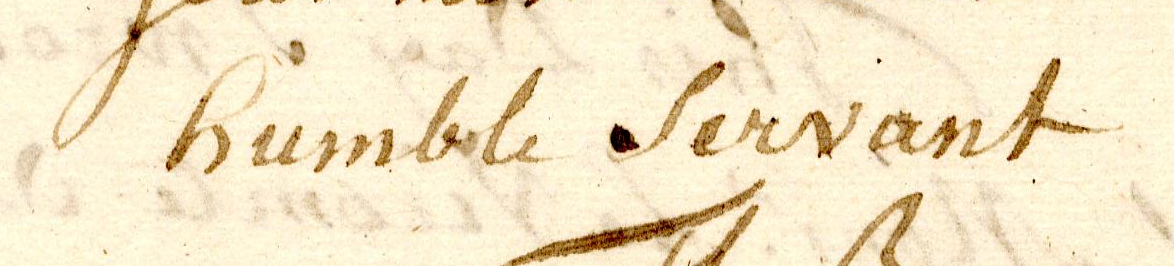humble servant
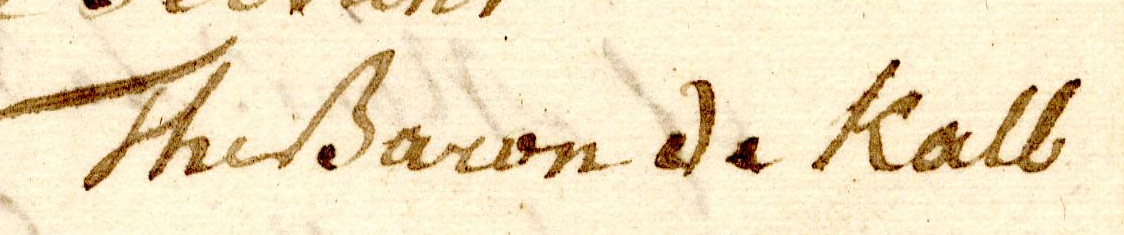The Baron de Kalb
